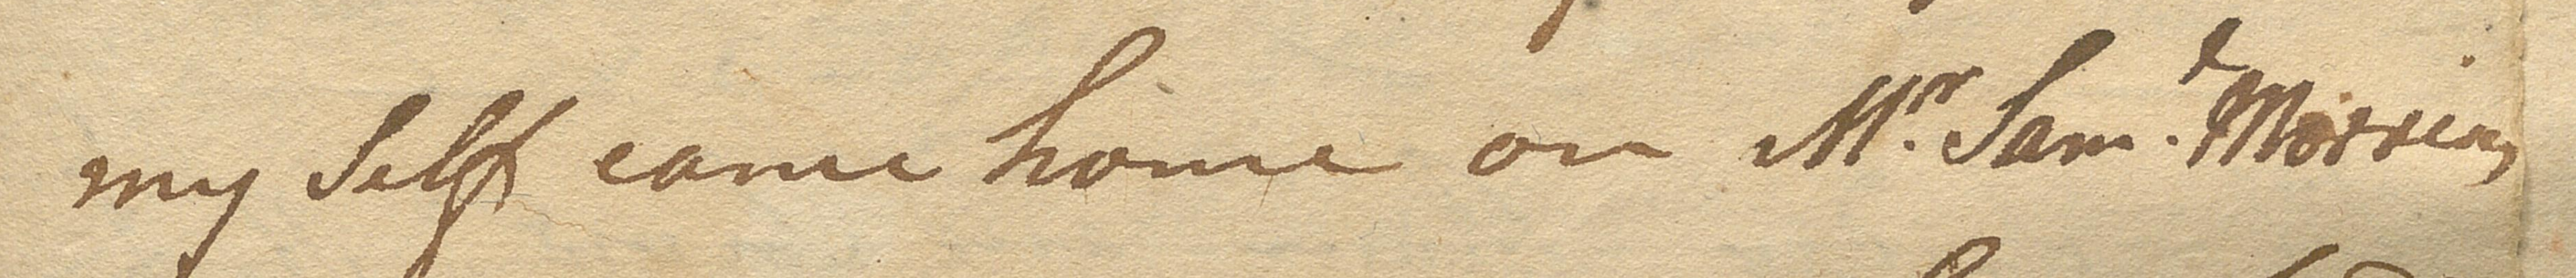my selff came home on M^r. Sam^l. Morrises
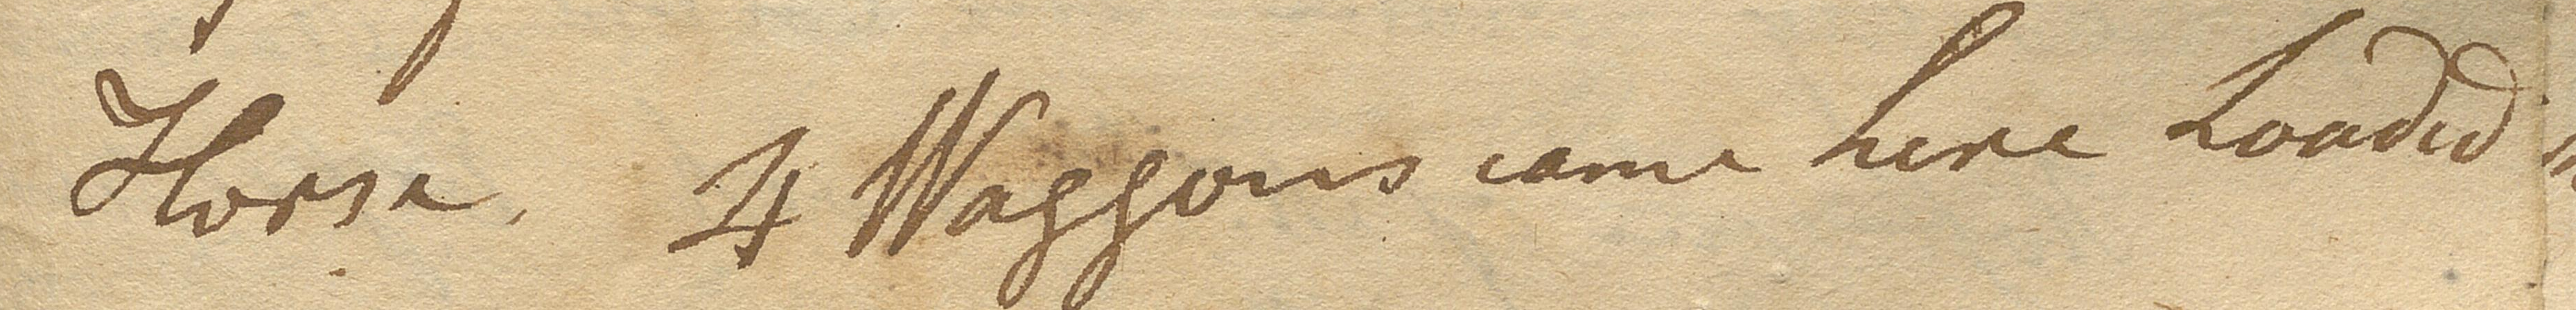Horse. 4 Waggons came here Loaded
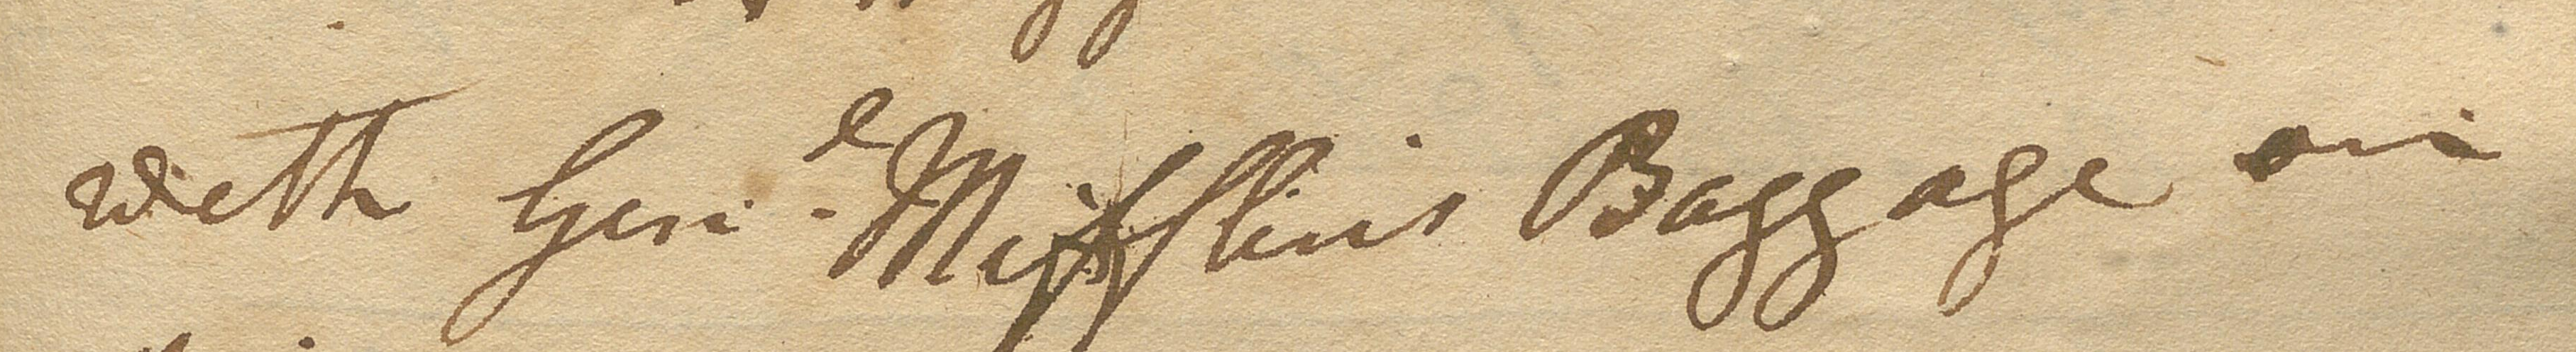with Gen^l. Miffflins Baggage on
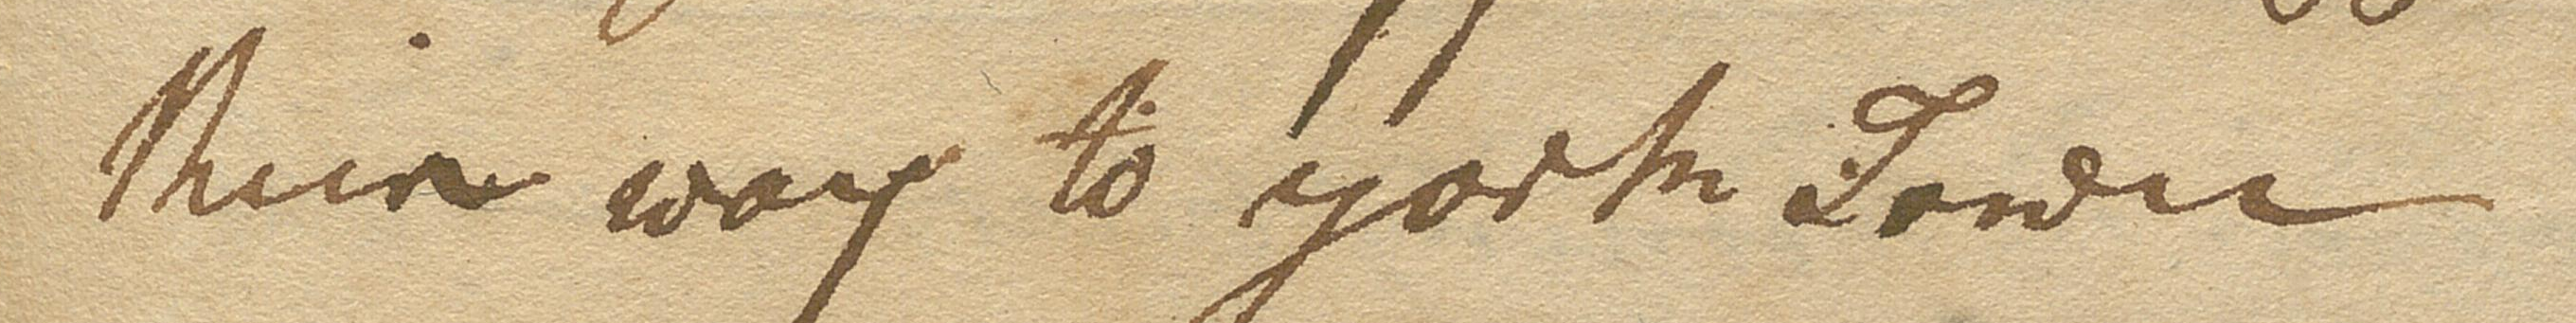their way to york Town
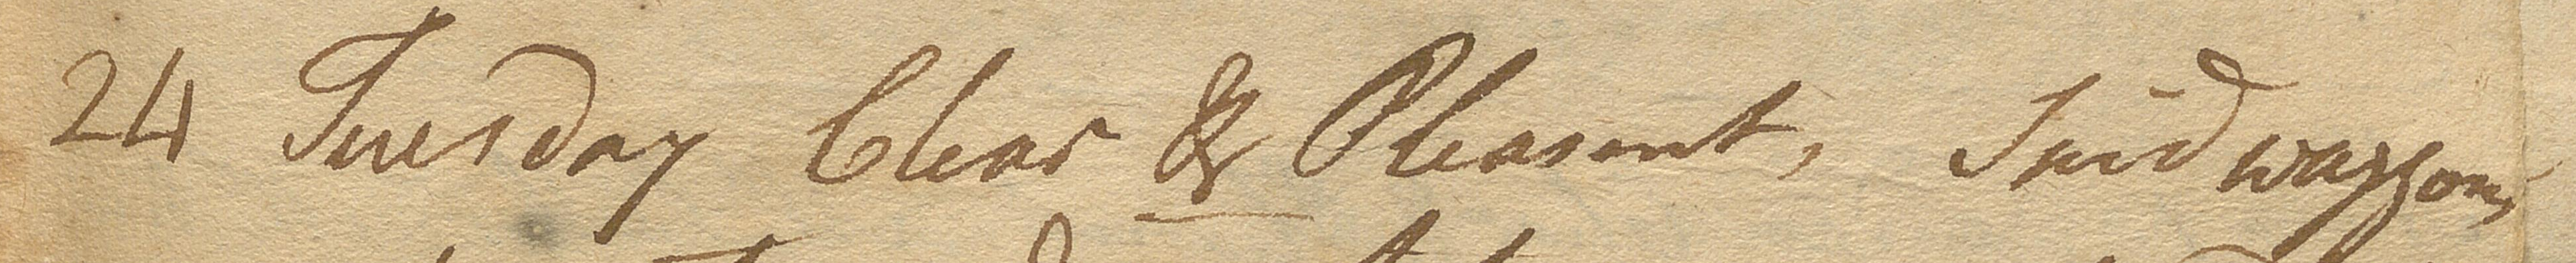24 Tuesday Clear & Pleasent, Said waygons
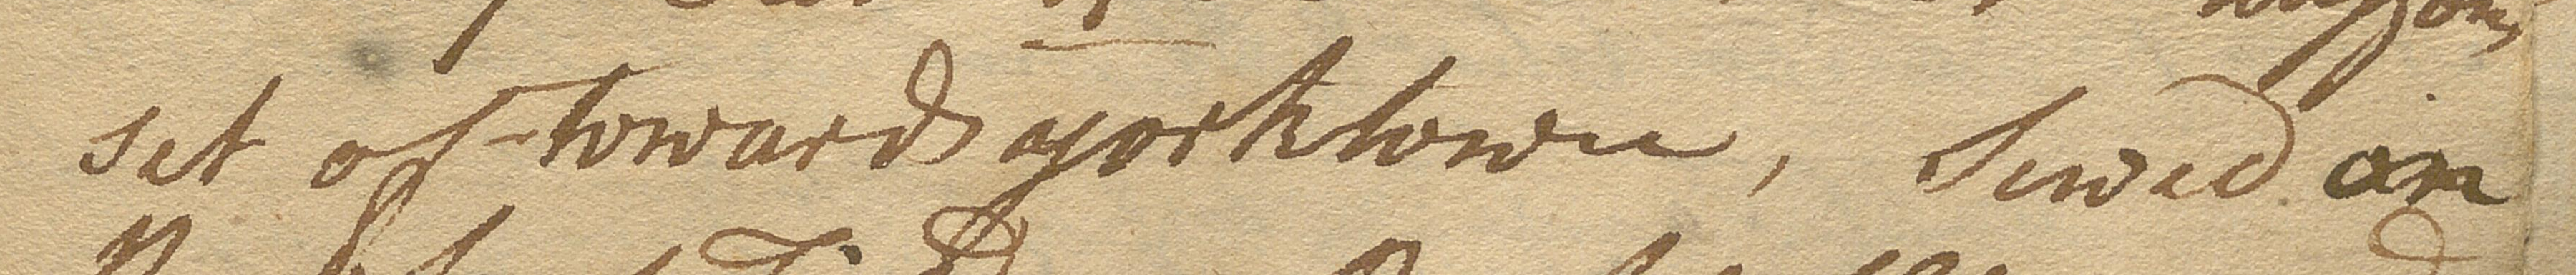set of towards yorktown, sewed on
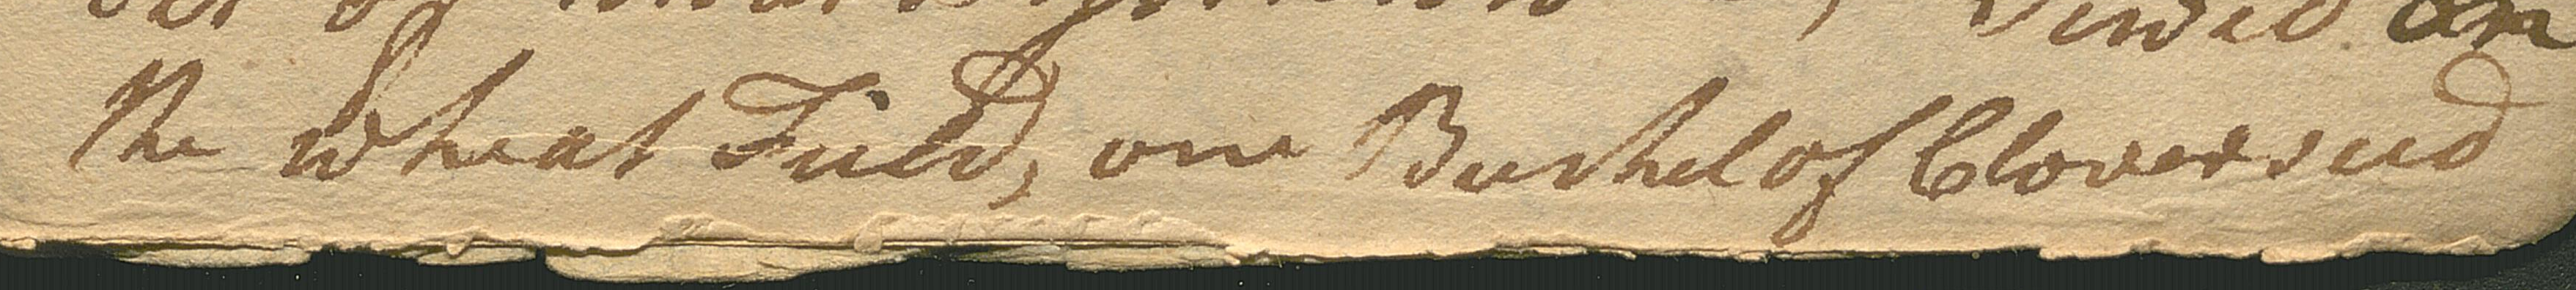the wheat Field, one Bushel of Cloverseed
